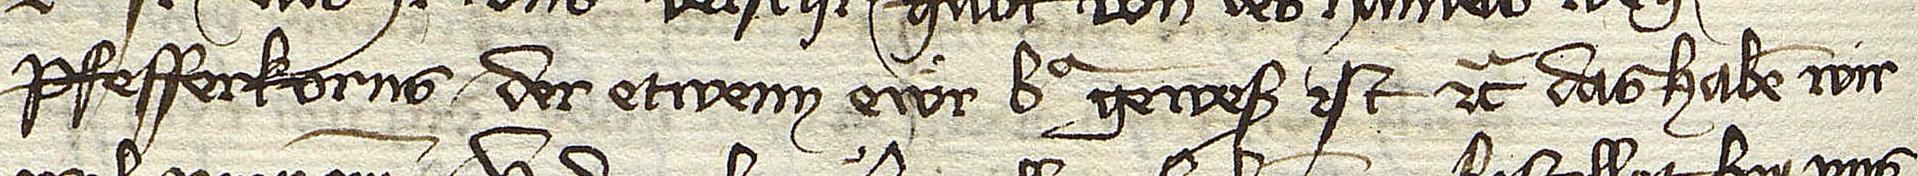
Pfefferkorns / der etwenn eẅr b* geweſ* iſt ec* das habe* wir
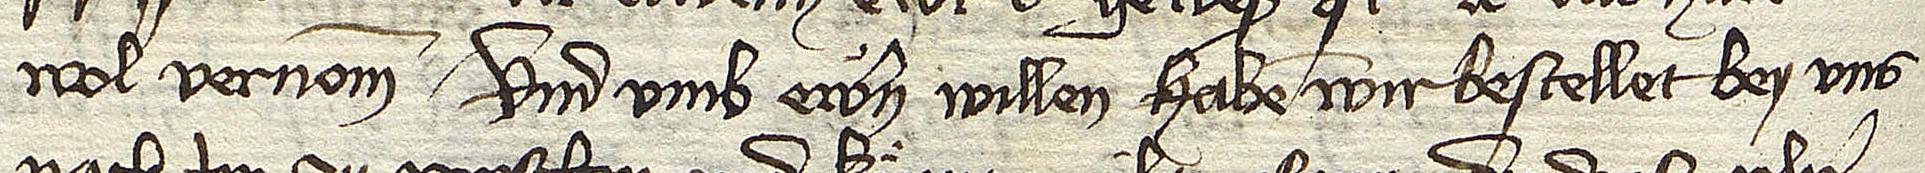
wol vernom* / Vnd vmb eẅn* willen habe* wir beſtellet bey uns
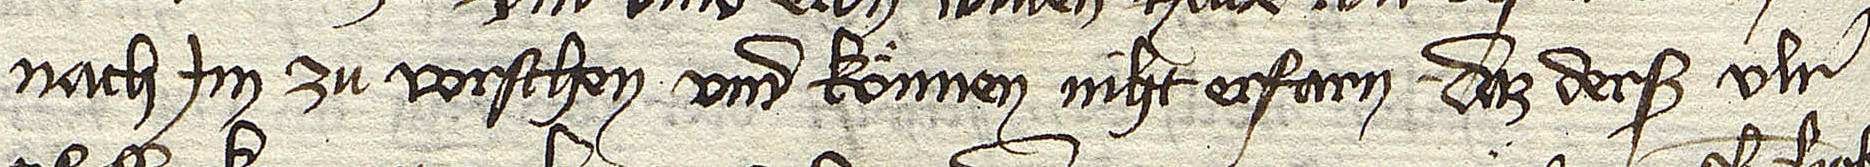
nach Im ʒu vorſchen vnd können niht erfarn daʒ derſ* vlr*
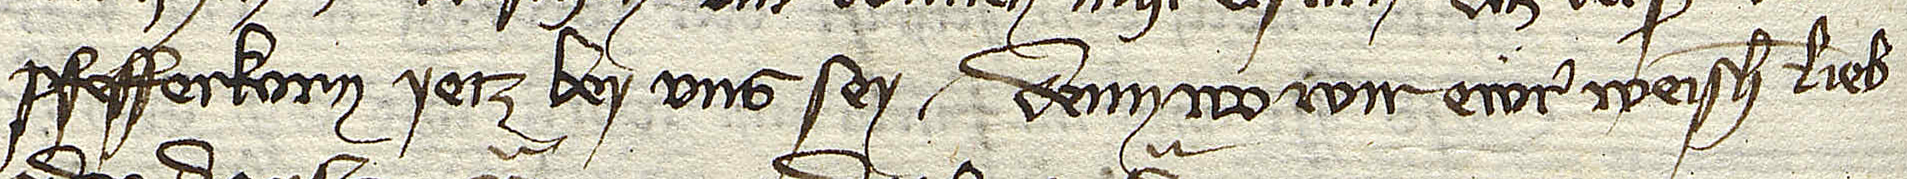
pfefferkorn yecʒ bey uns ſey / Denn wo wir eẅr weiſh* lieb
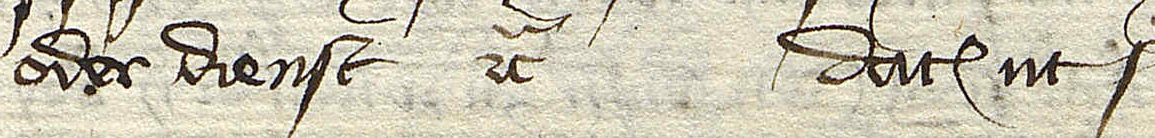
oder dienſt ec* Dat ut ſ*
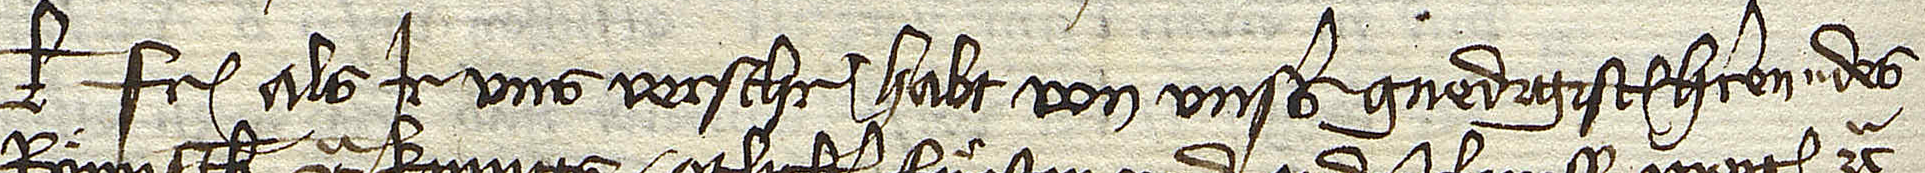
L* fr* als Ir vns verſchr* habt von vnſ*s gnedigiſt* hren* ~ des
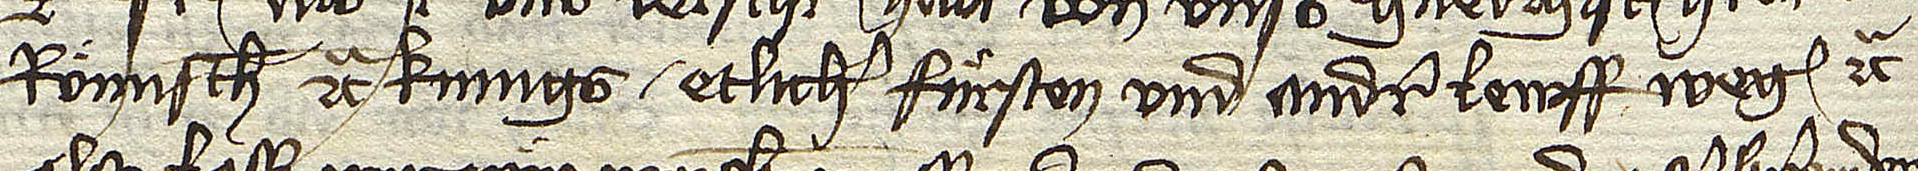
Römisch* ec* kunigs / etlich* fürſten vnd andr* lewff weg* ec*
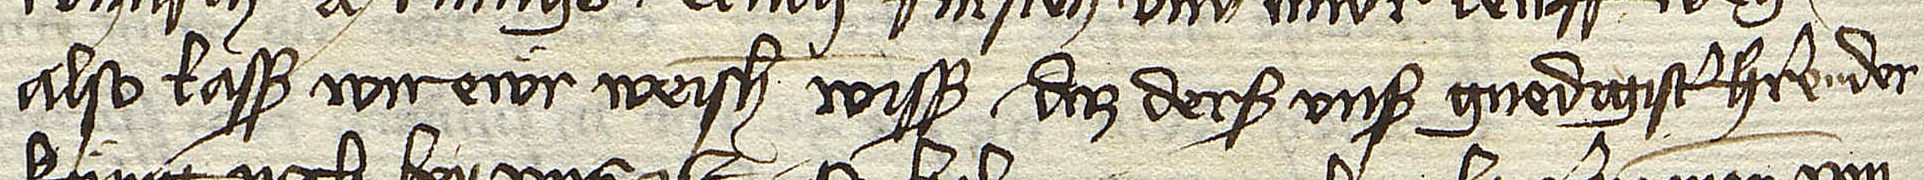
alſo laſſ* wir eẅr weiſh* wiſſ* / daʒ derſ* vnſ* gnedigiſt* hre* ~ der
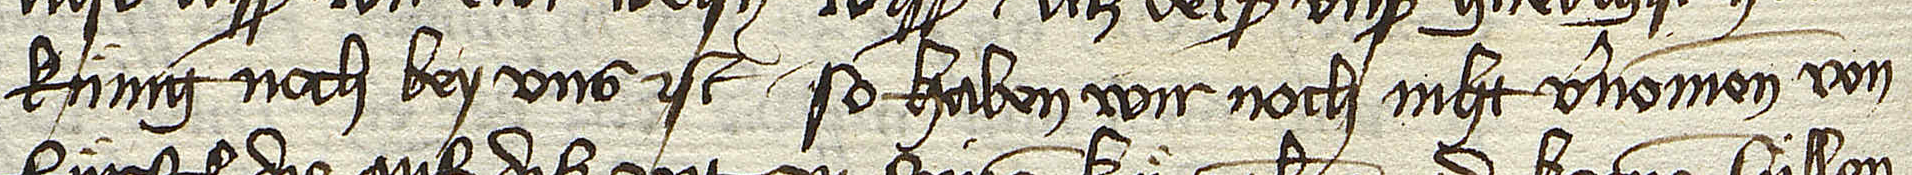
künig noch bey vns iſt / ſo haben wir noch niht vnomen* von
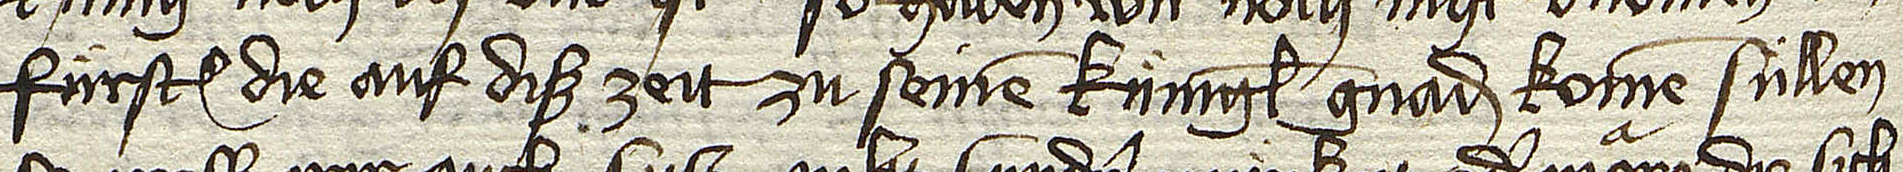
fürſt* die auf diſʒ ʒeit ʒu ſeine* künigl* gnad* kome* ſüllen
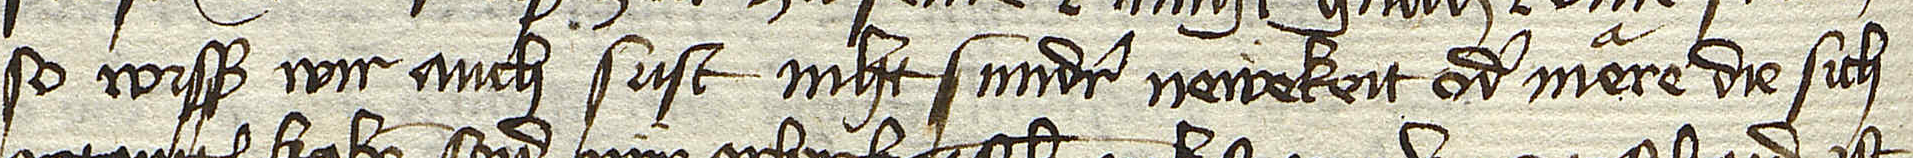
ſo wiſſ* wir auch ſuſt niht ſundr* neẅekeit od* mëre die ſich
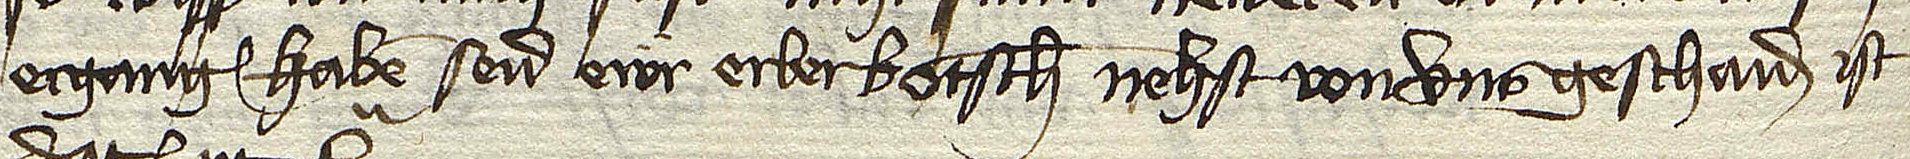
ergang* habe* ſeid eẅr erber botſch* nehſt von vns geſchaid* iſt
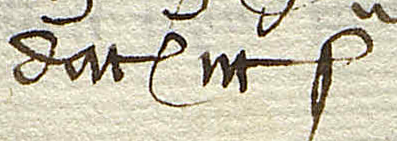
dat ut ſ*
